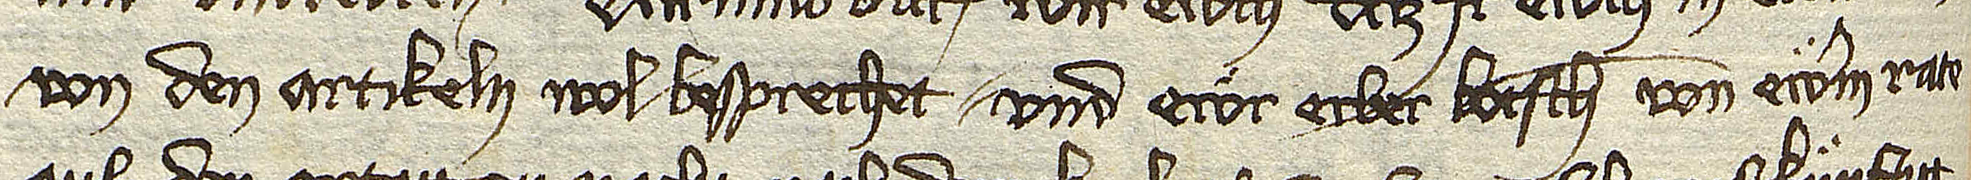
von den artikeln wol beſprechet / vnd ewr erber botſch* von ewm* rate
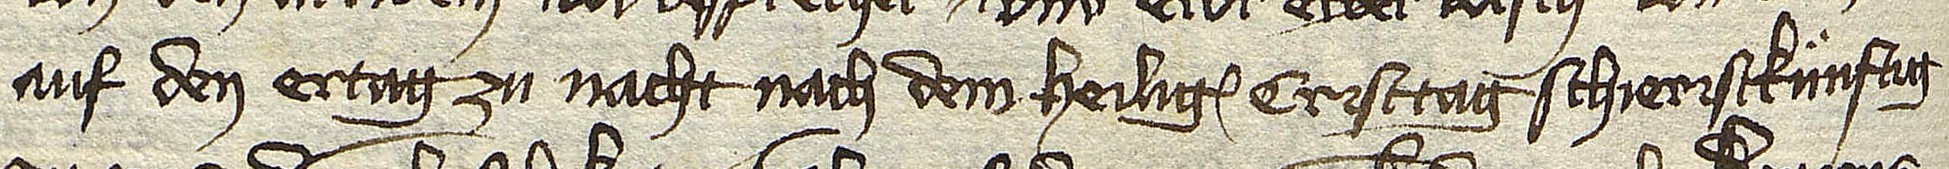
auf den ertag ʒu nacht nach dem heilig* Criſttag ſchieriſtkünftig
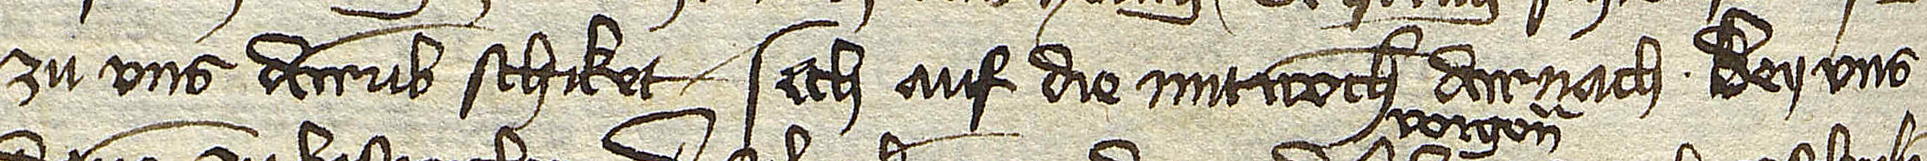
ʒu vns darub* ſchicket / ſich auf die mitwoch* darnach . bey vns
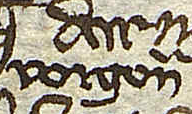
vorgen*
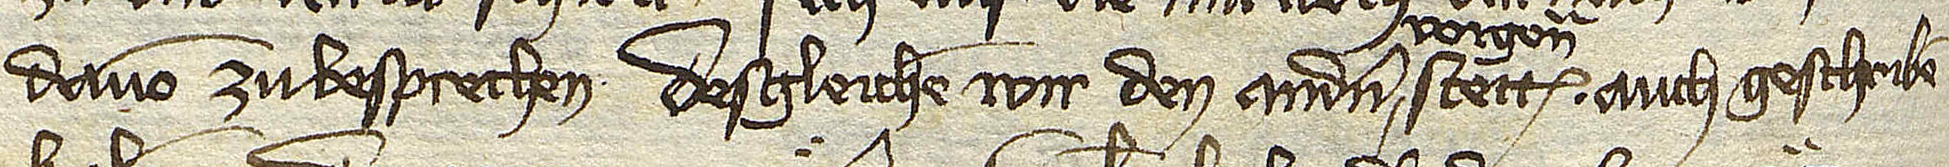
dauo* ʒu beſprechen . Deſgleiche* wir den and*n ſtett* auch geſchribe*
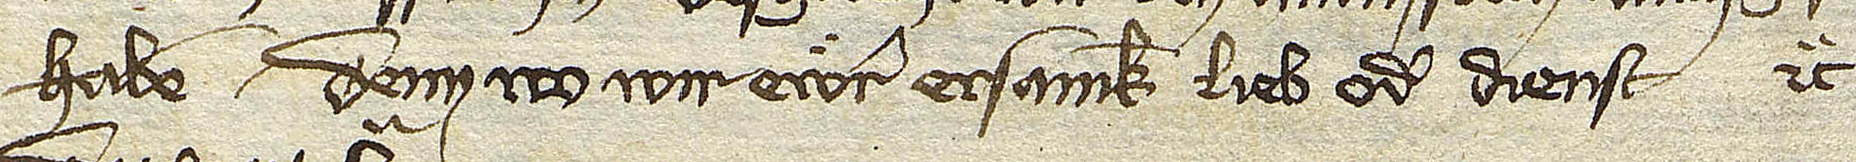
habe* / Denn wo wir ewr* erſamk* lieb od* dienſt ec*
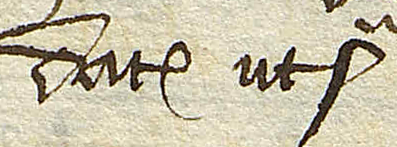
Dat* ut ſ*
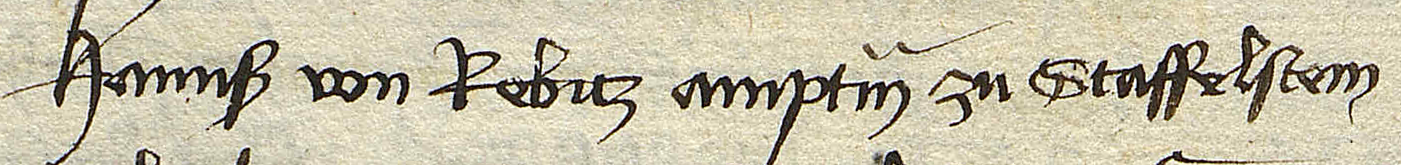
Hannſ* von Rebicʒ amptm* ʒu Staffelſtein
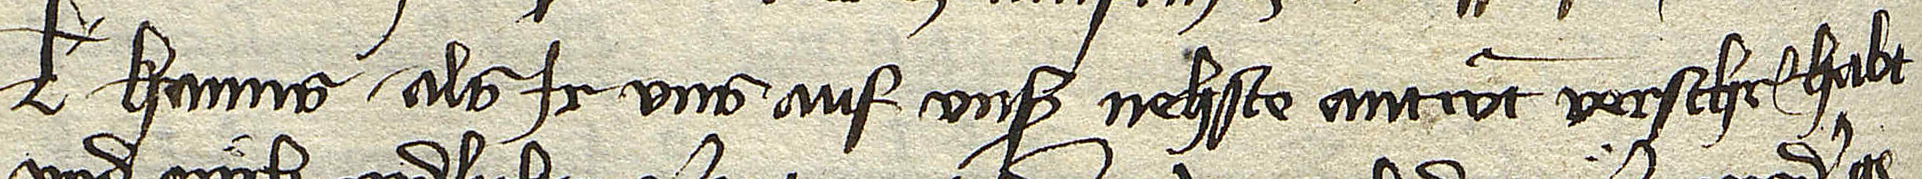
L* hanns / als Ir vns auf vnſ* nehſte antw*t verſchr* habt
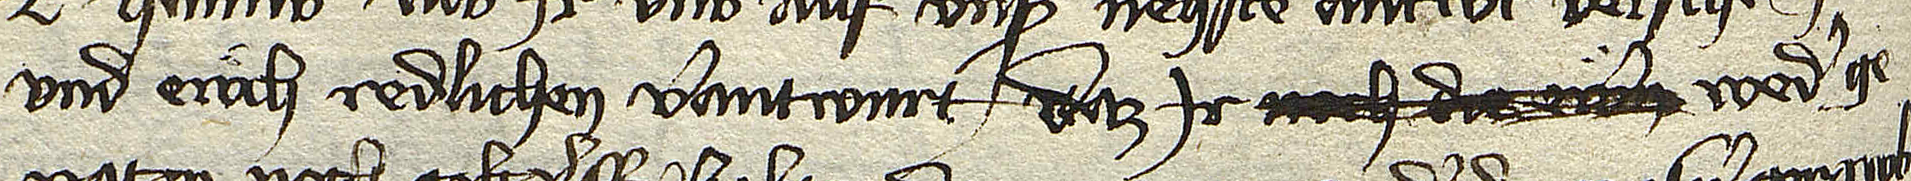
vnd eẅch redlichen v*antwurt / Daʒ Ir noch die ewn* wed* ge
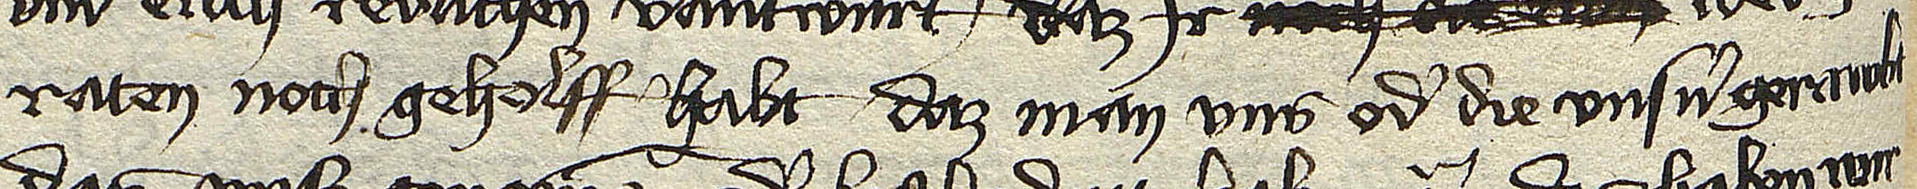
raten noch geholff* habt* / daʒ man vns od* die vnſ*n gerawbt
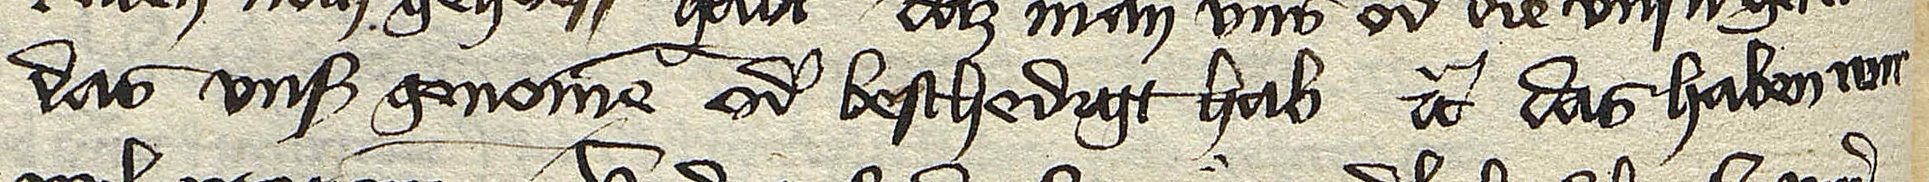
das vnſ* genome* od* beſchedigt hab etc das haben wir
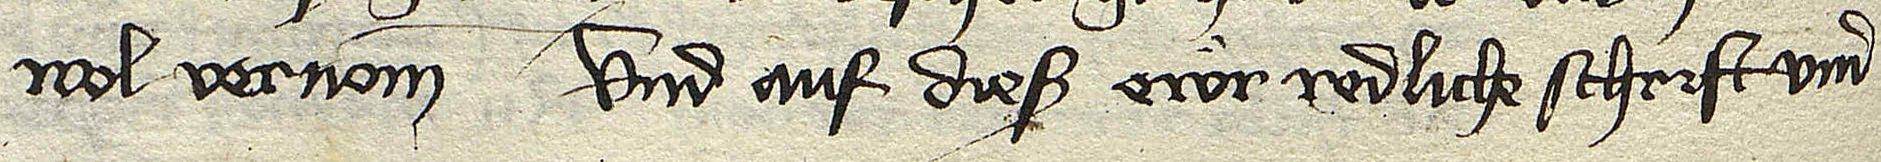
wol vernom* / Vnd auf dieſ* eẅr redliche ſchrift vnd
